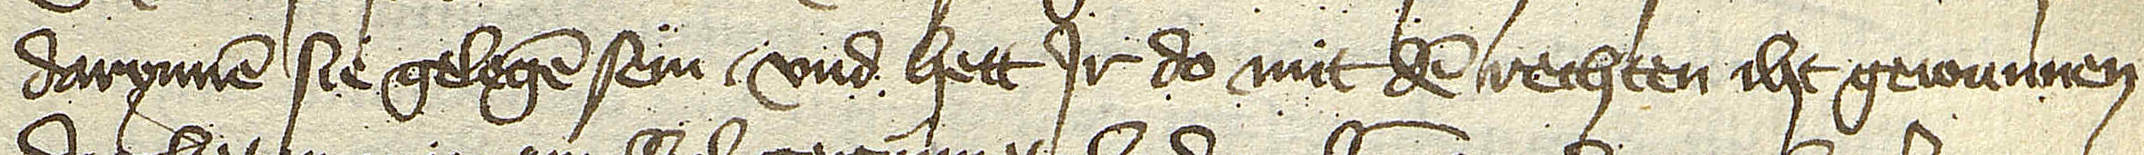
darynne* ſie gelege* ſein / vnd hett Ir do mit d* rechten iht gewunnen
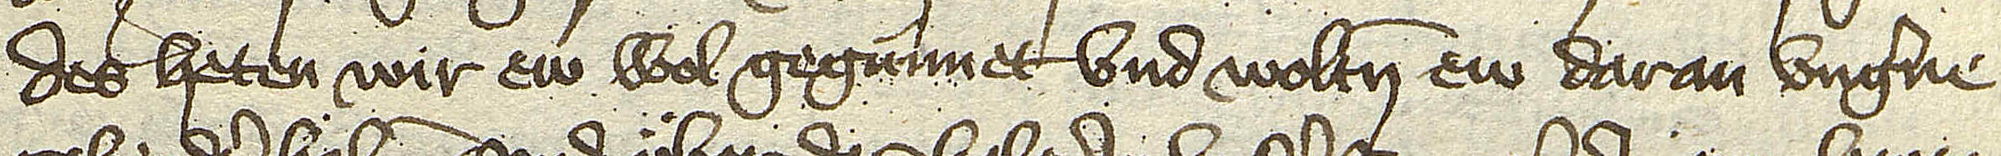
des heten wir ew wol gegünnet vnd woltn* ew daran vng*ne
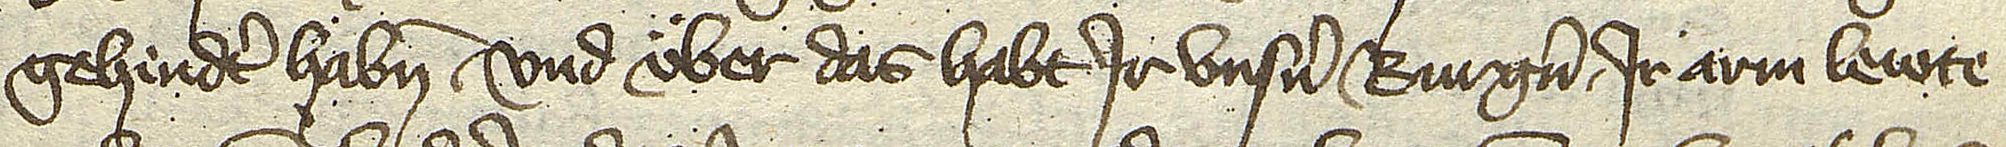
gehindt* habn* / vnd v̈ber das habt Ir vnſn* Burgn* / Ir arm lewte
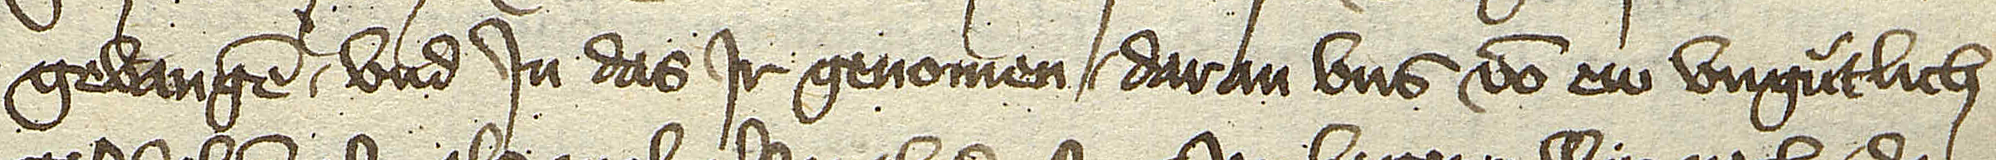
gevange* / vnd In das Ir genomen / daran vns vo* ew vngütlich
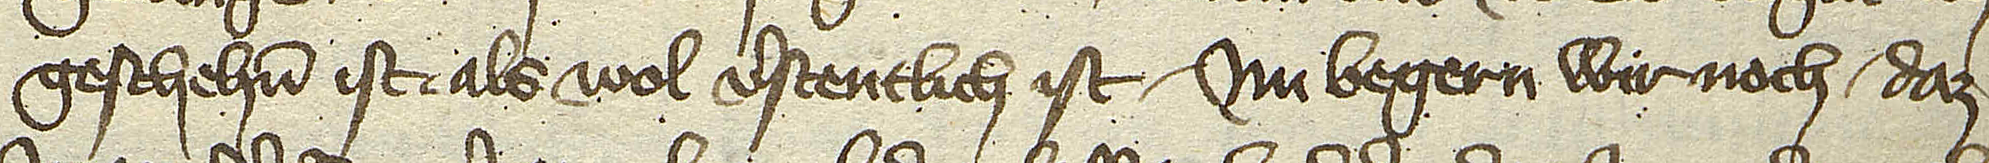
geſchehn* iſt / als wol v*ſtentlich iſt / Nu begern wir noch / daʒ
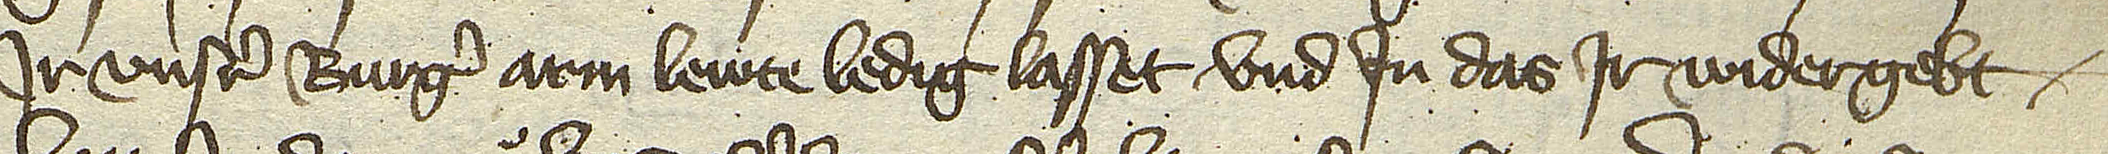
Ir vnſr* Burg* arm lewte ledig laſſet / vnd In das Ir widergebt /
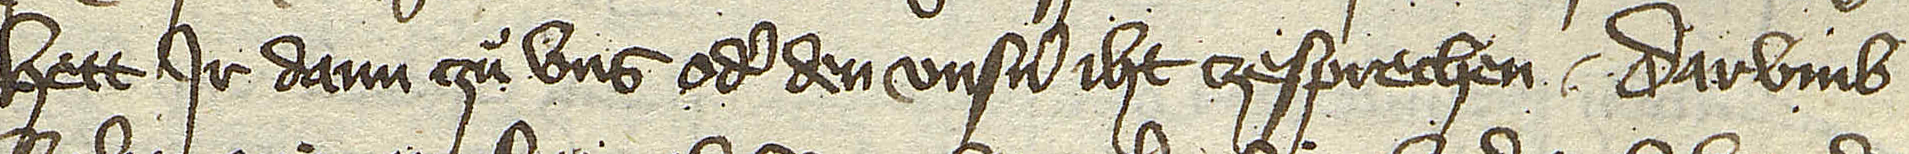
Hett Ir dann cʒü vns od* den vnſn* iht cʒeſprechen / Darvmb
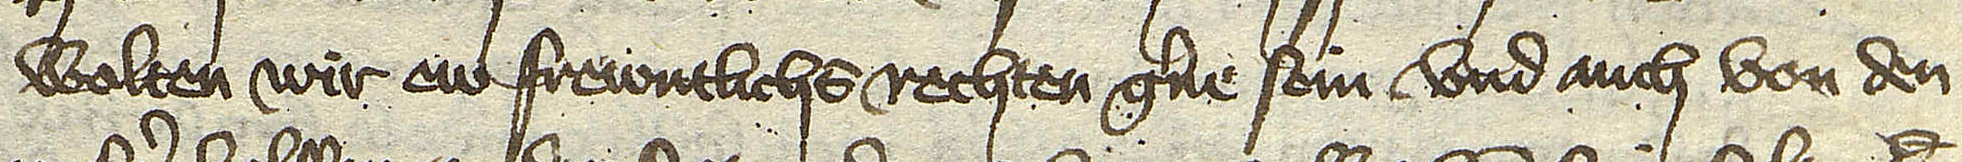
wolten wir ew frewntlichs rechten g*ne ſein / vnd auch von den
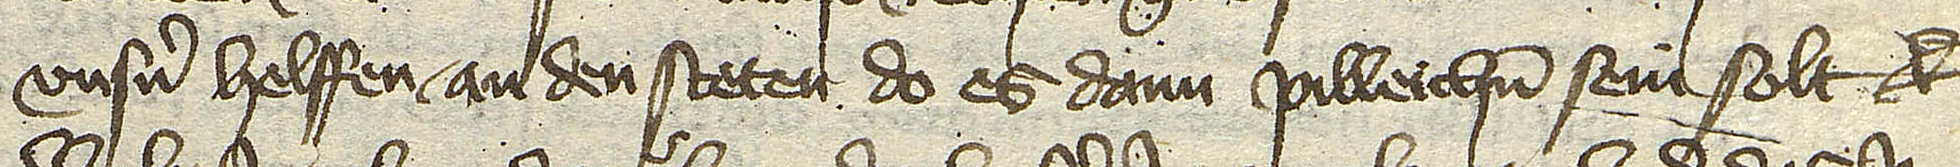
vnſn* helffen / an den ſteten do es dann pilleichn* ſein ſolt / %
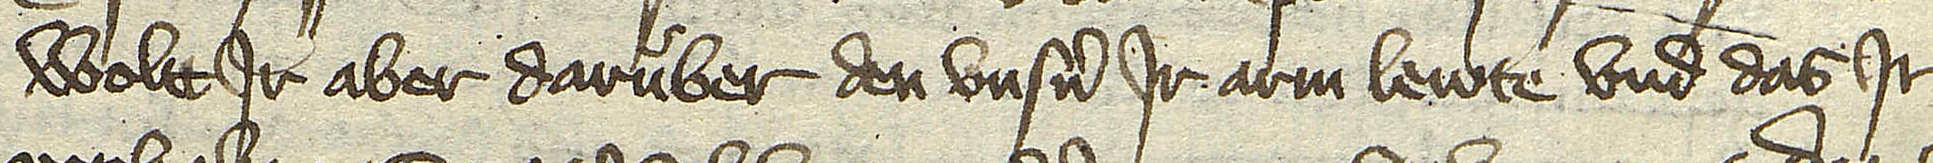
Woltt Ir aber darüber den vnſn* Ir arm lewte vnd das Ir
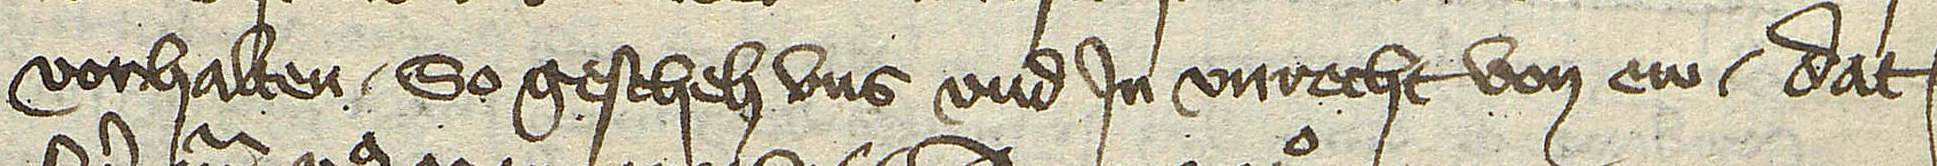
vorhalten / So geſcheh vns vnd In vnrecht von ew / Dat*
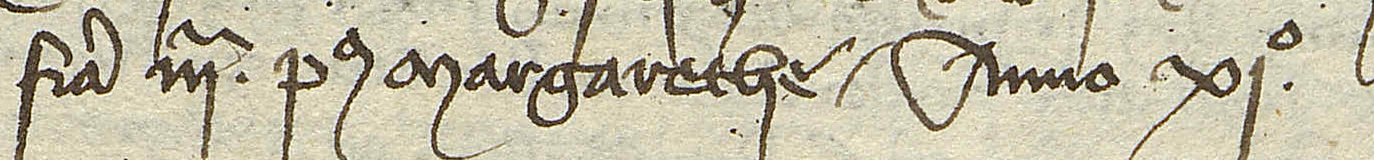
fia* iii* . p* Margarethe* / Anno xi*.
